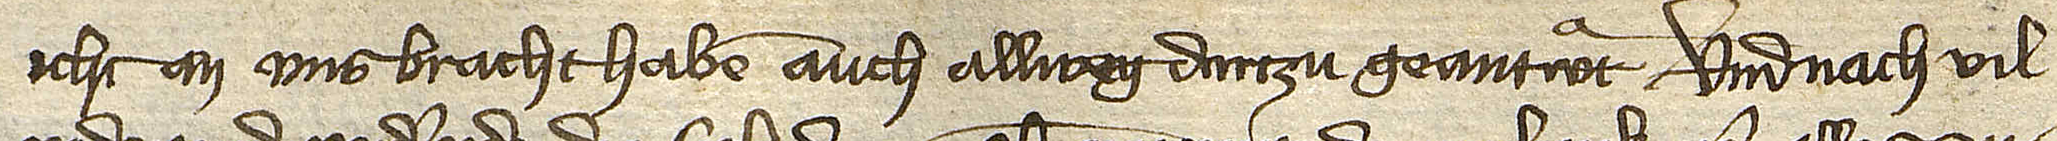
icht an vns bracht habe* auch allweg darcʒu geantw*t / Vnd nach vil
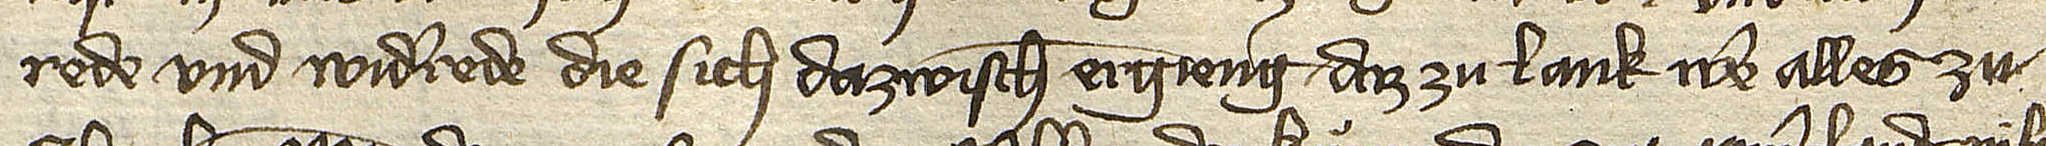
rede vnd wid*rede die ſich daſwiſch* ergieng / daʒ ʒu lank w*e alles ʒu
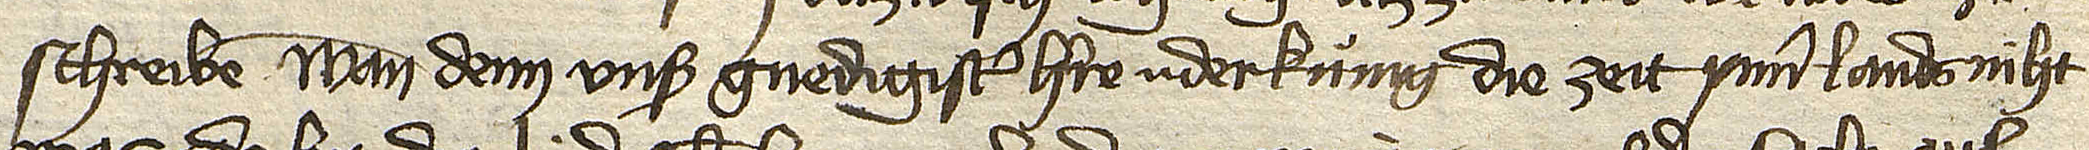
ſchreibe* Wan denn vnſ* gnedigiſt* h*re ~ der künig die ʒeit ynn* lands niht
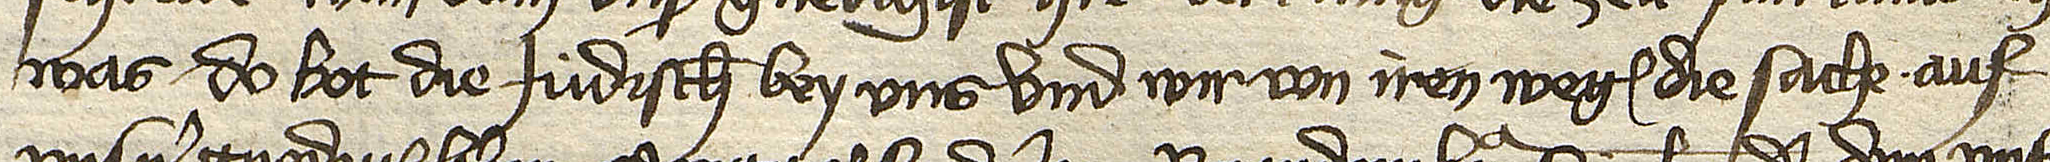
was / Do bot die Iüdiſch* bey vns vnd wir von iren weg* die ſache . auf
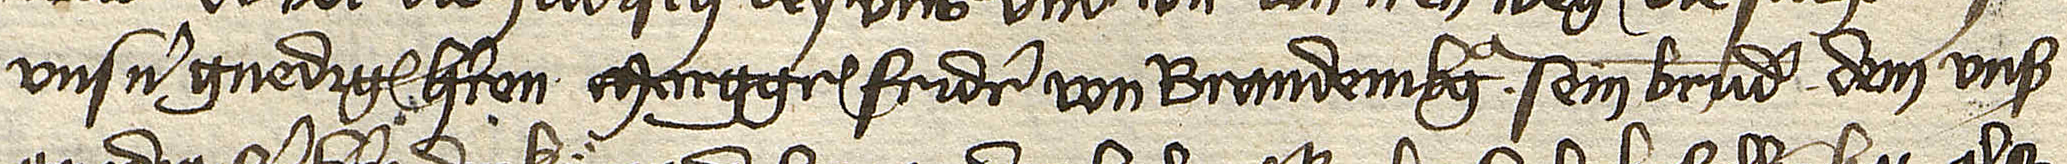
vnſn* gnedig* h*ren Marggr* fridr* von Brandemb*g . ſein brud* . dem vnſ*
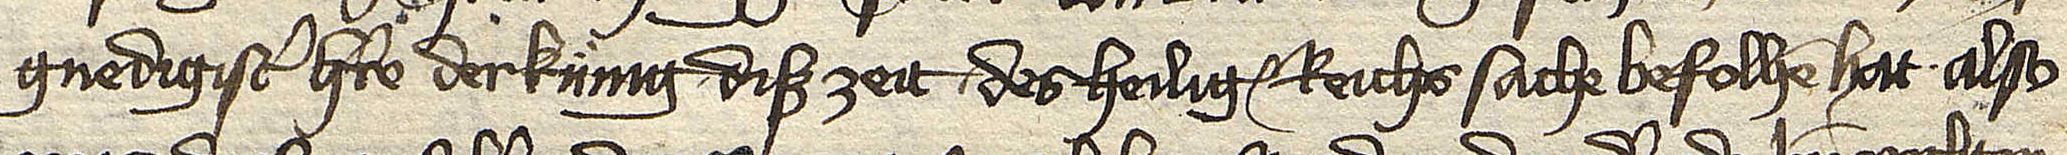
gnedigiſt* h*re der künig / diſʒ ʒeit / des heilig* Reichs ſache befolhe* hat . alſo
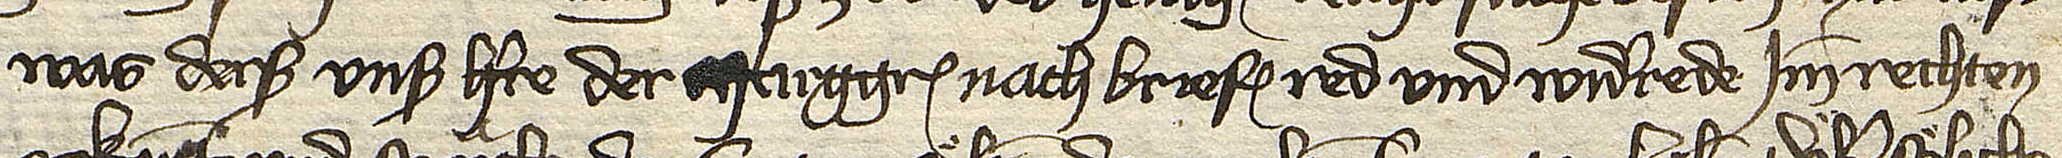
was derſ* vnſ* h*re der Marggr* nach brief* red vnd wid*rede Im* rechten
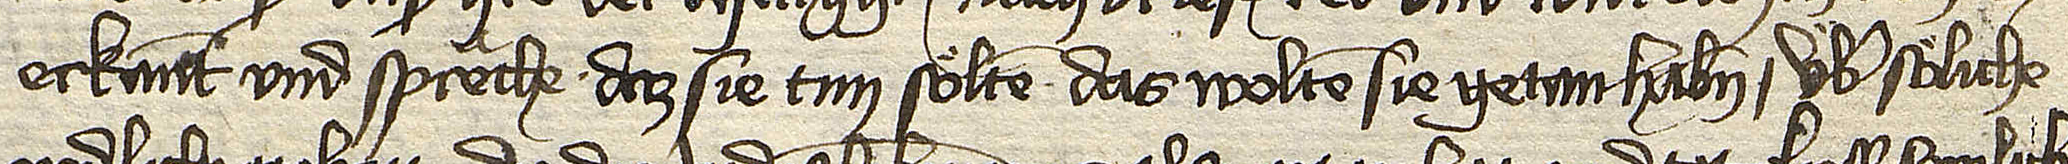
erkan*t vnd ſprëche . daʒ ſie tun ſölte* . das wolte* ſie getan habn* / V̈b* ſöliche
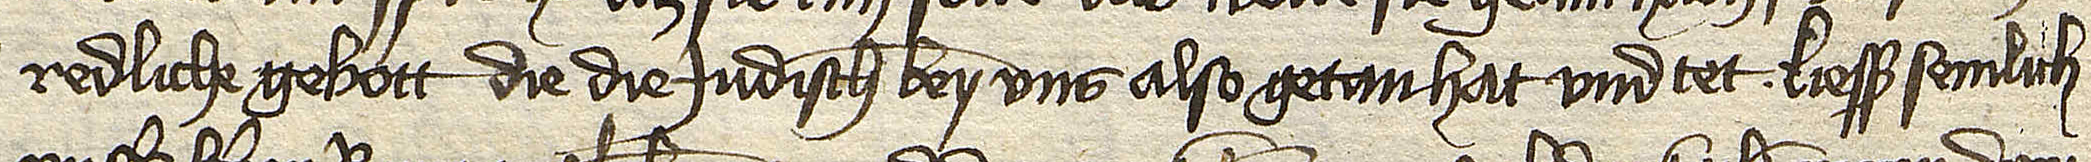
redliche gebott die die Iudiſch* bey vns alſo getan hat vnd tet . lieſſ* ſemlich
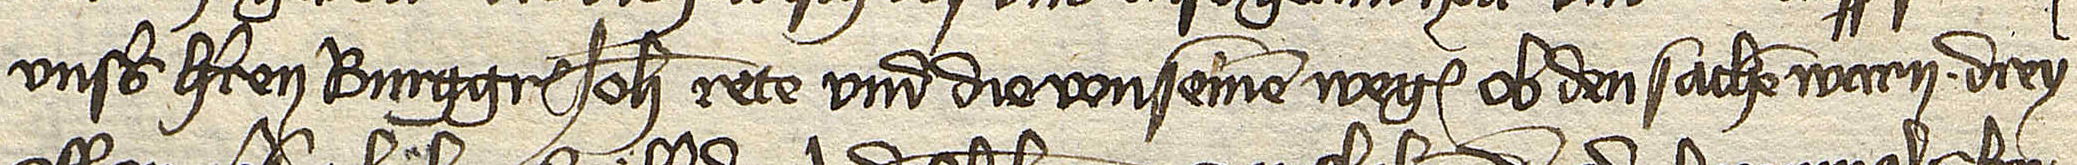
vnſ*s h*ren Burggr* Ioh* rete vnd die von ſeine* weg* ob den ſache* warn . drey
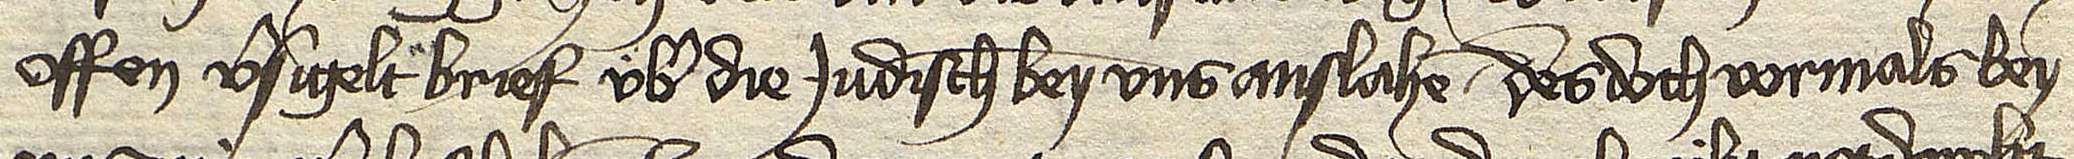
offen v*ſigelt brief v̈b* die Iudiſch* bey vns anſlage* / Des doch vormals bey
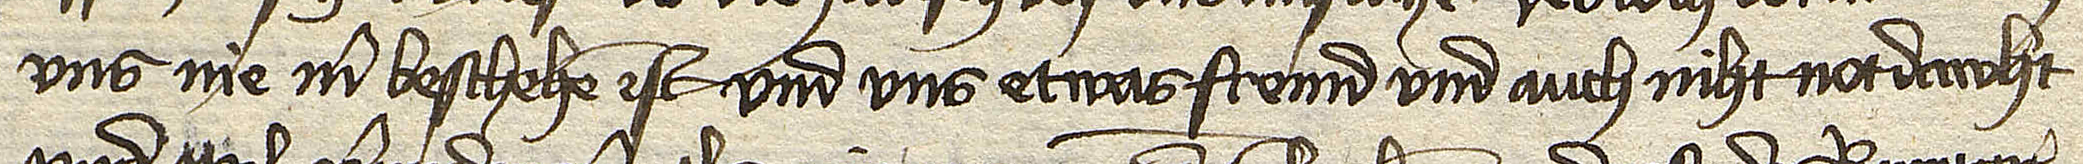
vns nie m* beſchehe* iſt vnd vns etwas fremd vnd auch niht not dawht
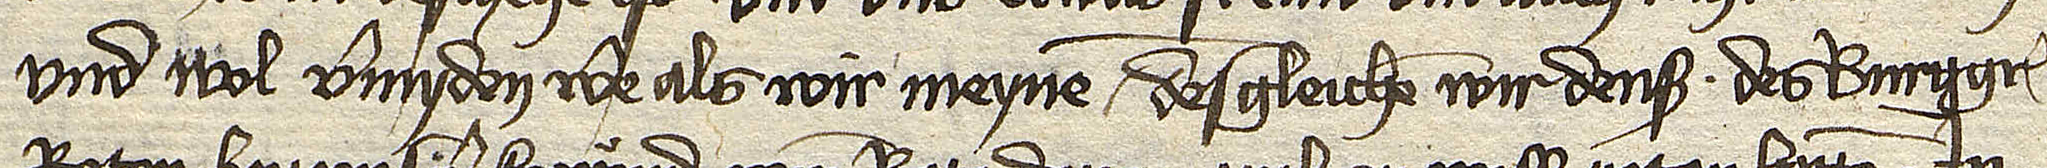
vnd wol v*myden w*e als wir meyne* / Deſgleiche* wir denſ* . des Burggr*
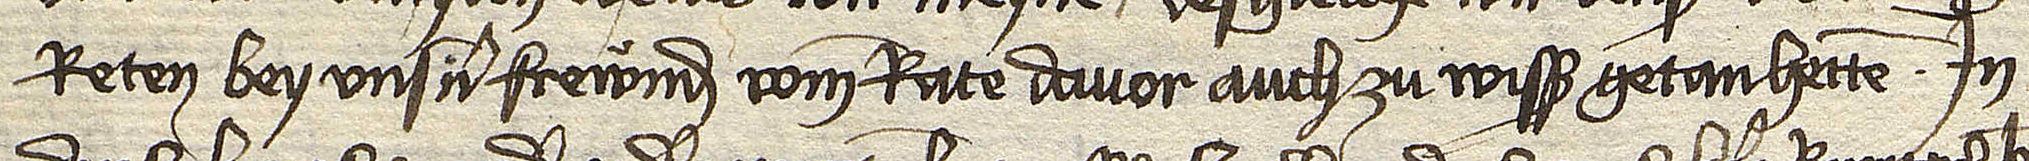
Reten bey vnſn* freẅnd* vom* Rate dauor auch ʒu wiſſ* getan hette* . In
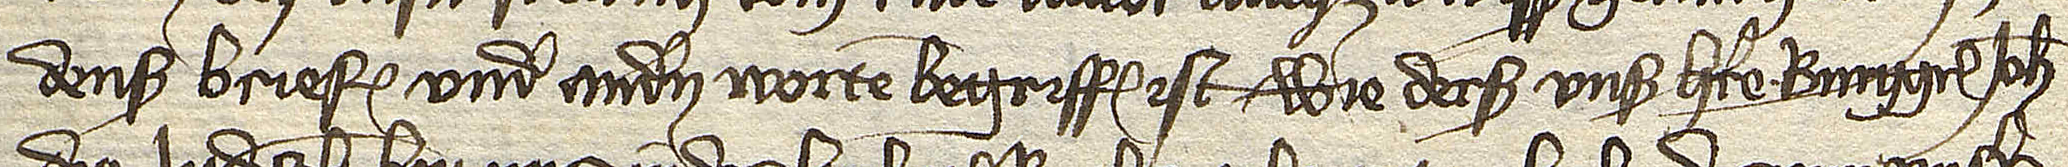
denſ* brief* vnd* and*n worte* begriff* iſt / wie derſ* vnſ* h*re . Burggr* Ioh*
